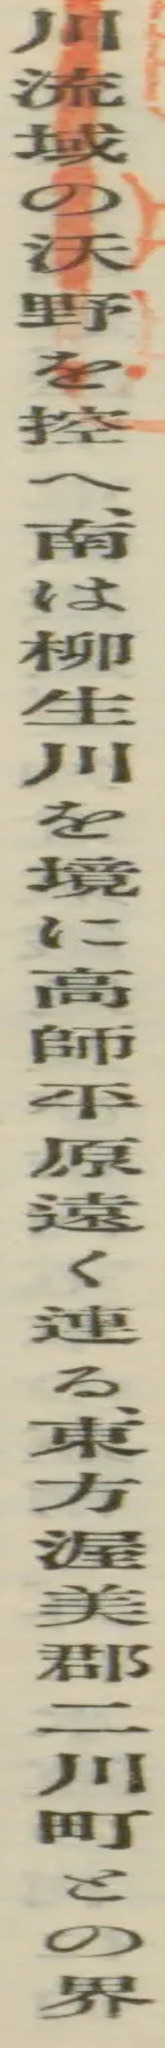川流域の沃野をひかえ控へ、南は柳生川を境に高師平原遠く連る、東方渥美郡二川町との界
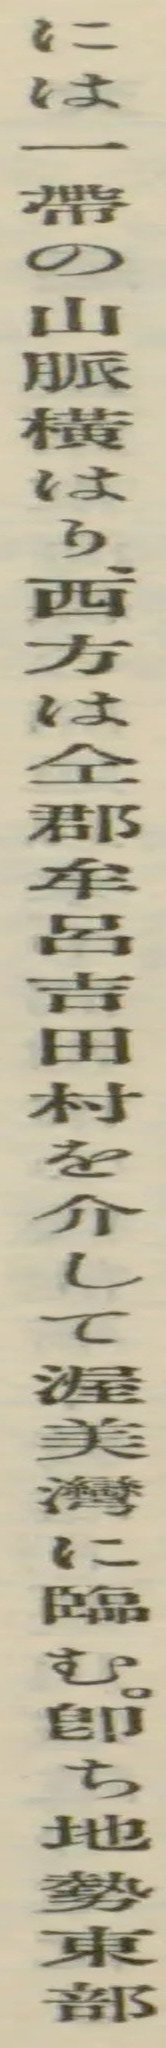には一帯の山脈横はり、西方は同牟呂吉田村を介して渥美湾に臨む。即ち地勢東部
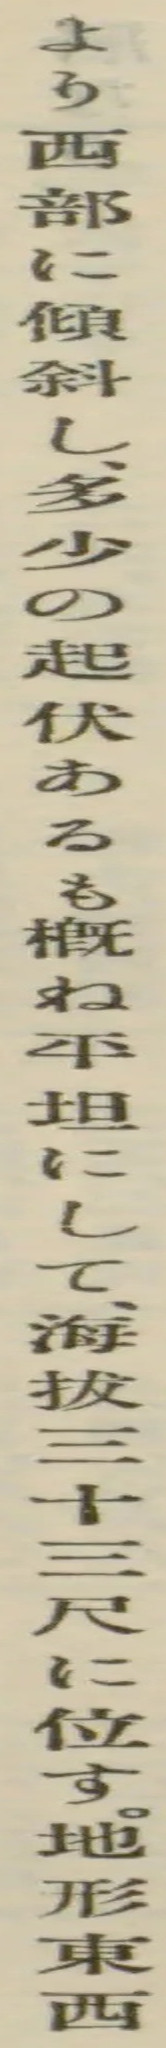より西部に傾斜し、多少の起伏あるも概ね平坦にして、海抜三十三尺に位す。地形東西
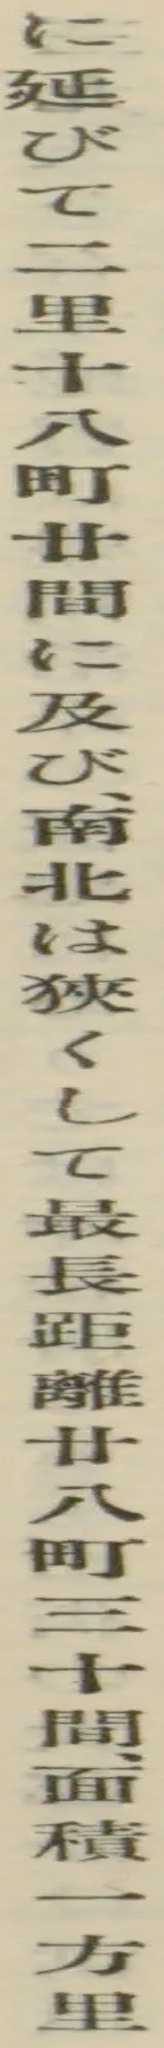に延びて二里十八町廿間に及び、南北は狭くして最長距離廿ｈ八町三十間、面積一方里

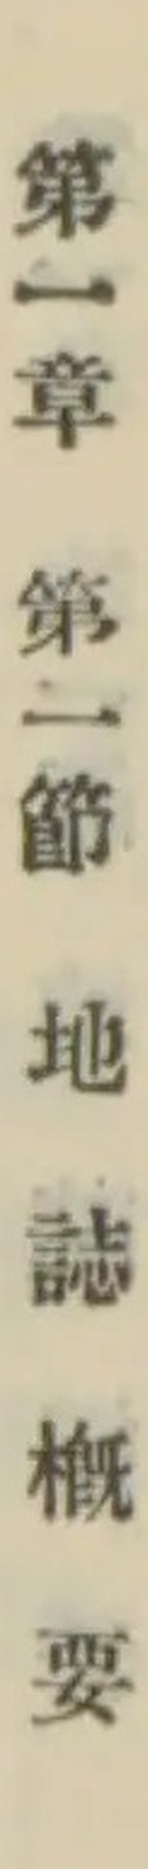第一章第一節地誌概要二
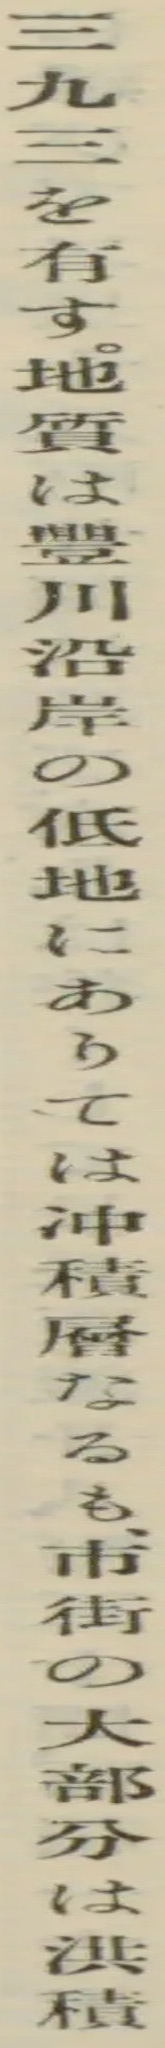三九三を有す。地質は豊川沿岸の低地にありては沖積層なるも、市街の大部分は洪積
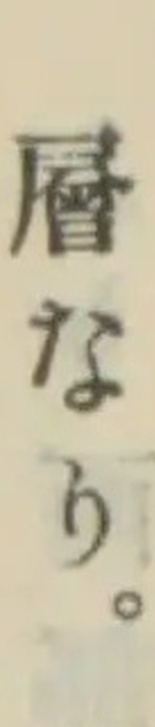層なり。
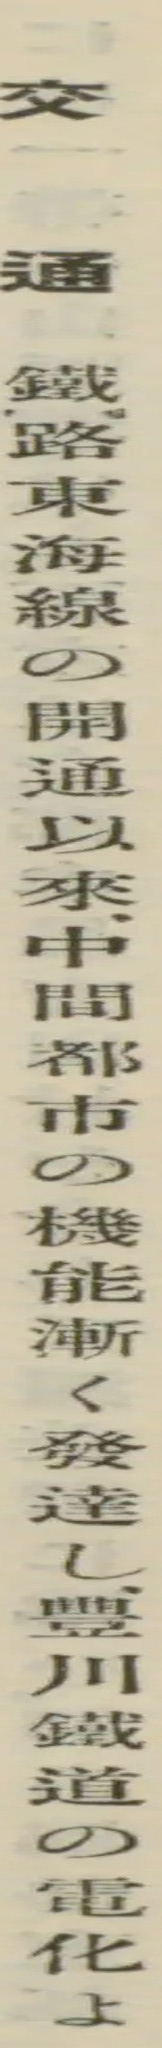交通鉄路東海道線の開通以来、中間都市の機能漸く発達し、豊川鉄道の電化よ
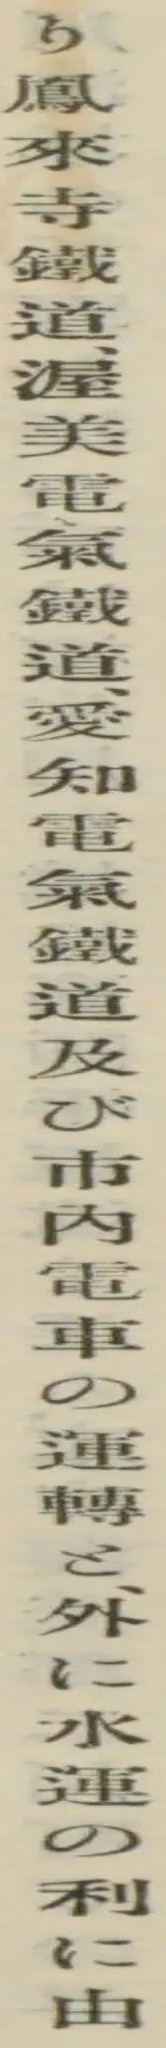り、鳳来寺鉄道、渥美電気鉄道、愛知電気鉄道及び市内電車の運転と、外に水運の利によ由
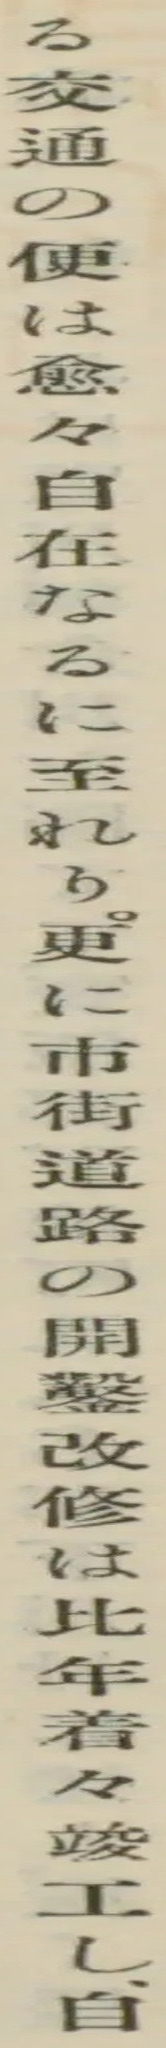る交通の便は愈愈自在なるに至れり。更に市街道路の開鑿改修は比年着々竣工し、自
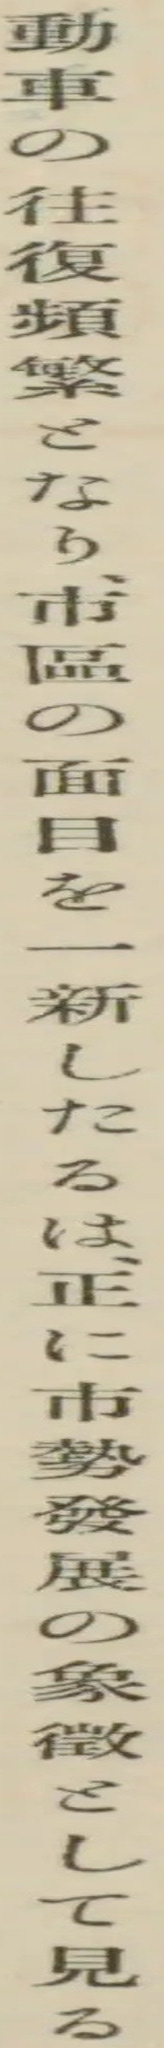動車の往復頻繁となり、市区のめんもく面目を一新したるは、市勢発展の象徴として見る
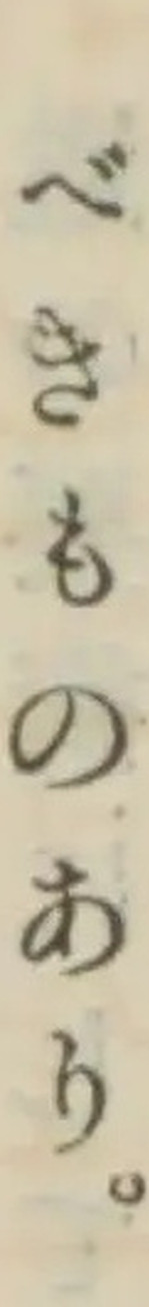べきものあり。
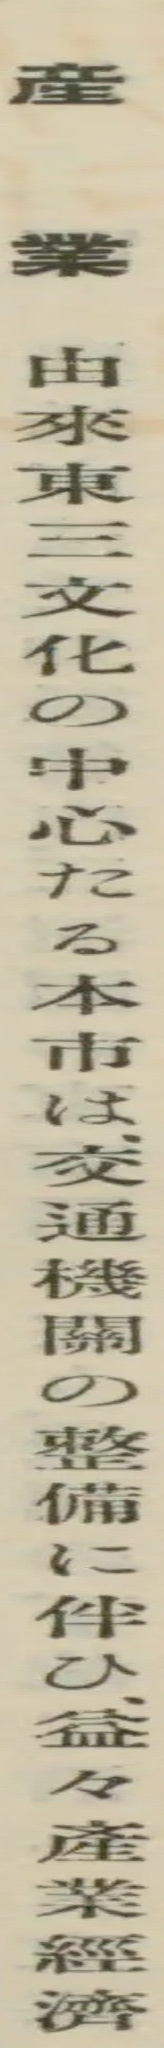産業由来東三文化の中心たる本市は、交通機関の整備に伴ひ、益々産業経済
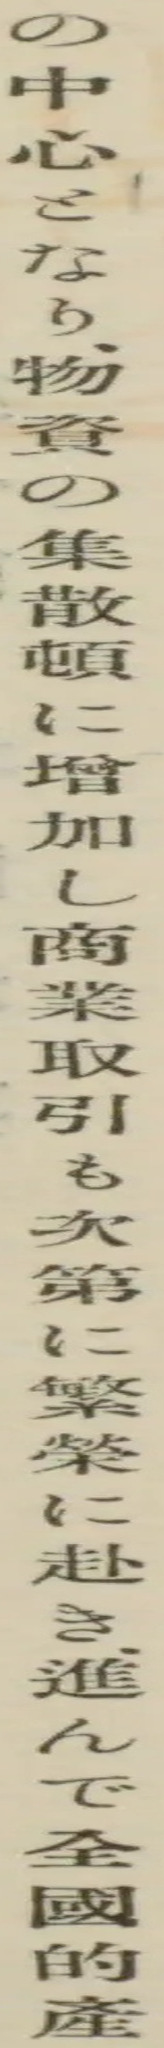の中心となり、物資の集散頓に増加し商業取引も次第に繁栄に赴き、進んで全国的産
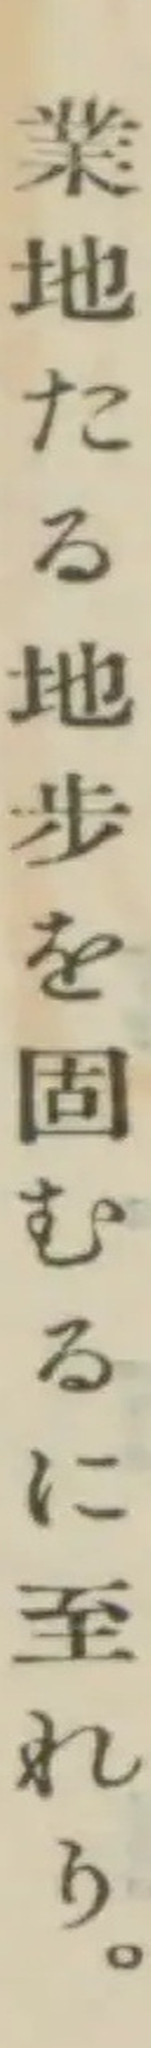業地たる地歩を固むるに至れり。
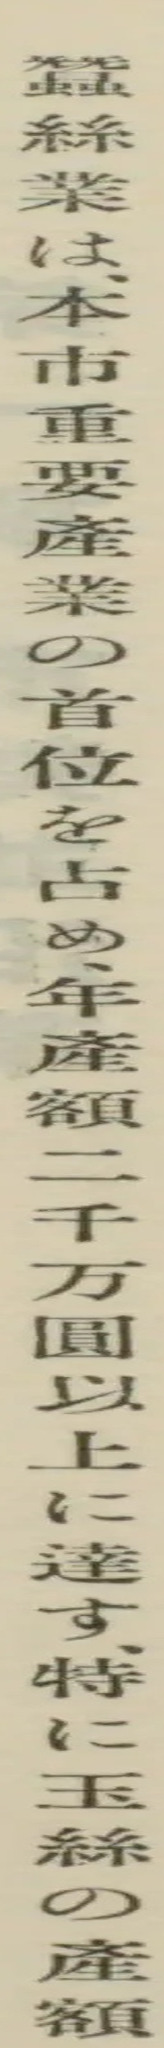蠶絲業は、本市重要産業の首位をし占め、産額二千万円以上に達す、特に玉絲の産額
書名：豊橋市水道誌
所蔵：国立国会図書館 National Diet Library, JAPAN
